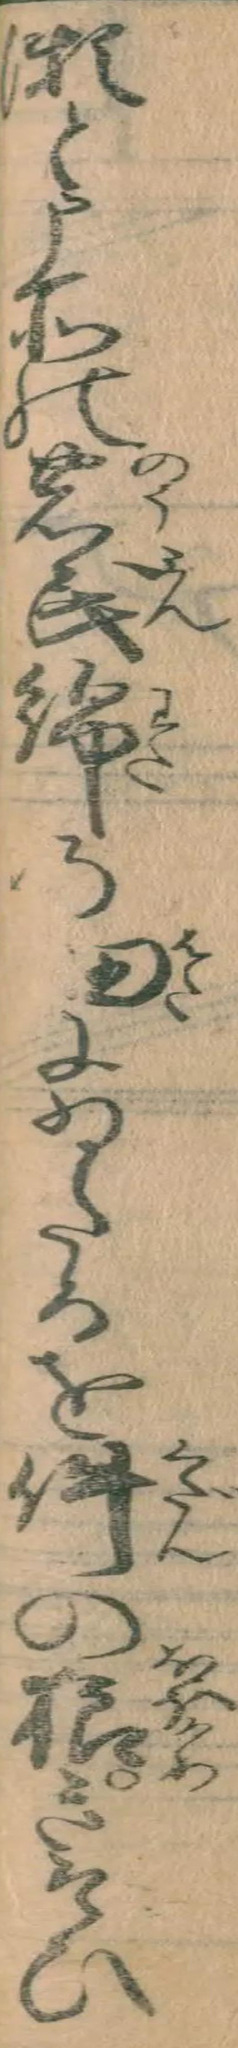瀬と申所の農民綿の畑にゐたるを件の狼。きそひ
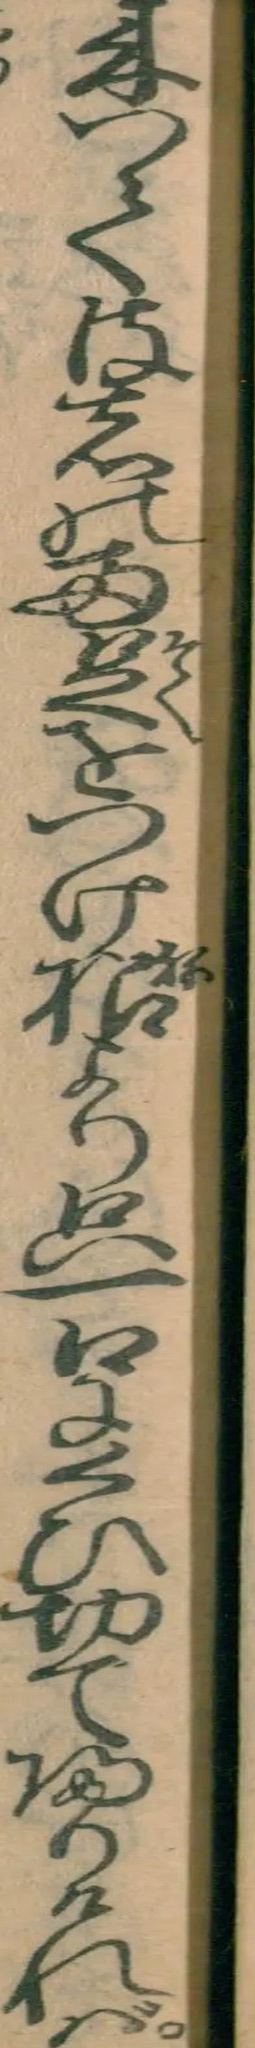来つて彼者の両足をつけ根より只一口にくひ切て帰りければ。
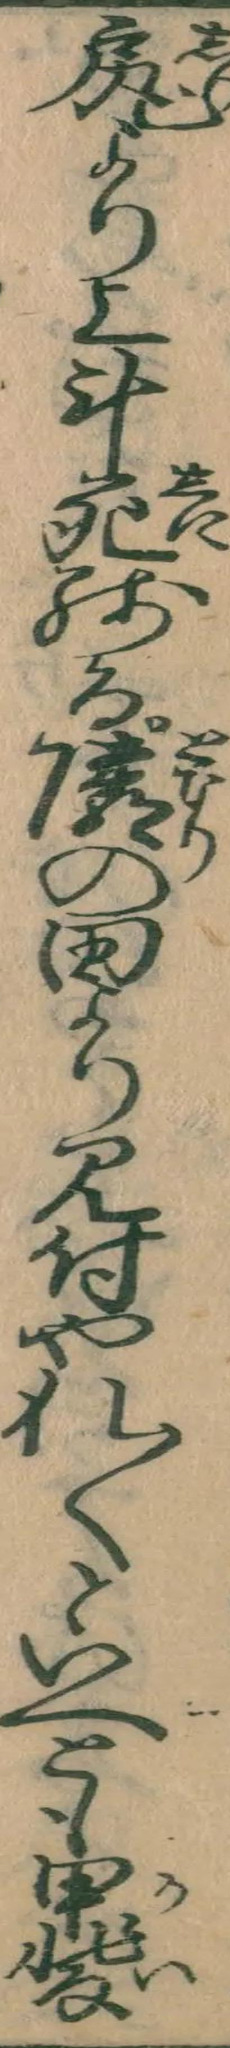尻より上計死残る。隣の田より見付やれ〳〵といへとも甲斐
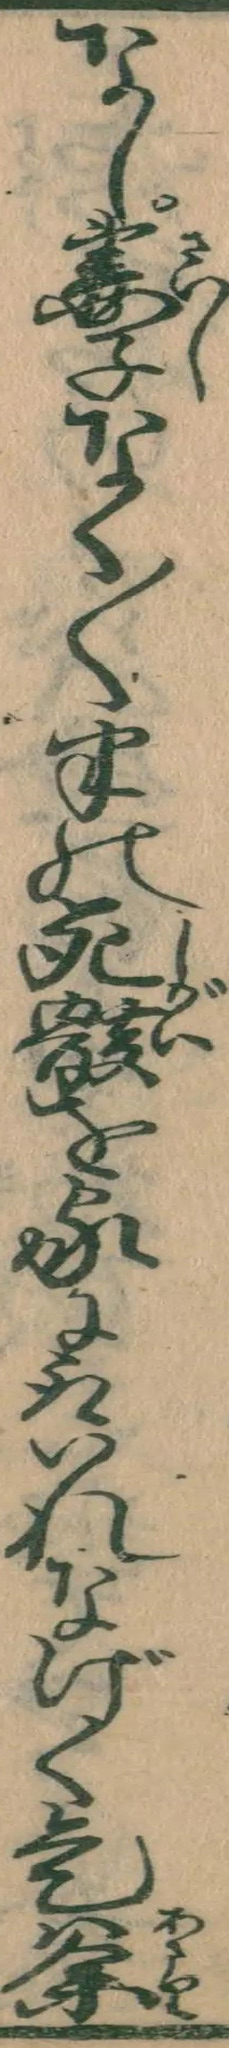なし。妻子なく〳〵半の死骸を家に取いれなげく是は余
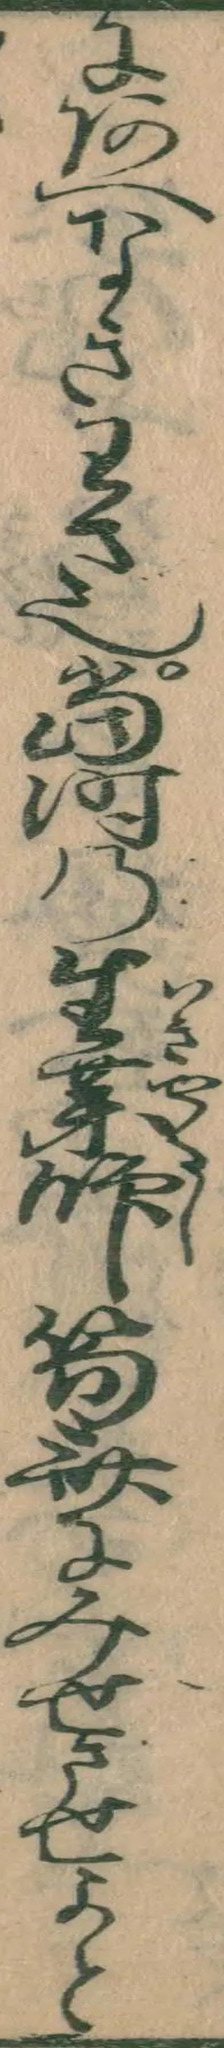にあへなきわさ也。当時の生薬師筍斎にみせさせよと
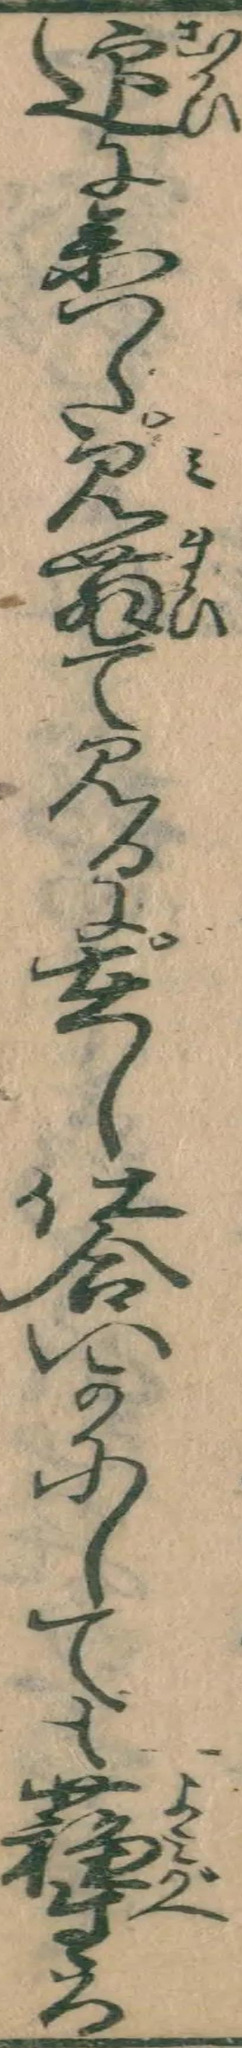迎に参つた。見舞て見るに。在し仕合いかにしても蘇生る
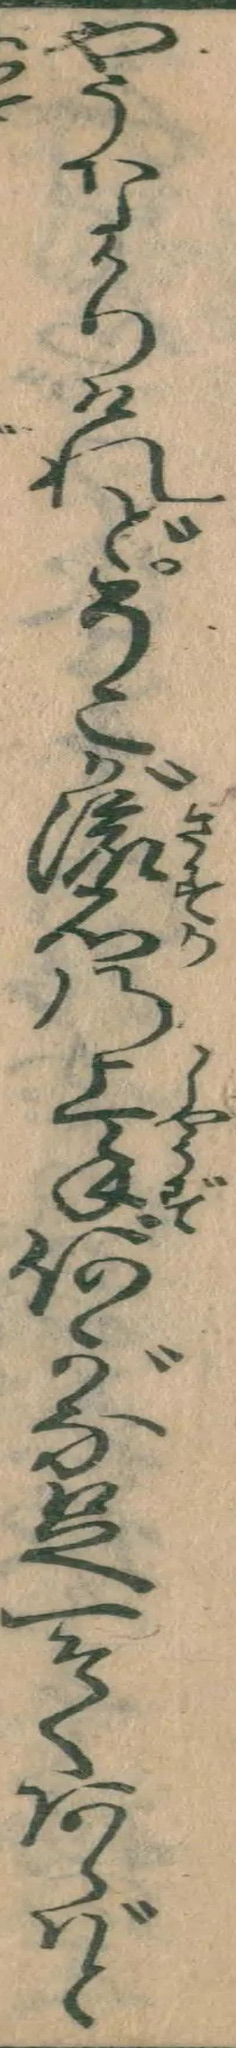やうなかりけれど。そこが流石の上手何がな足一そくあらばと
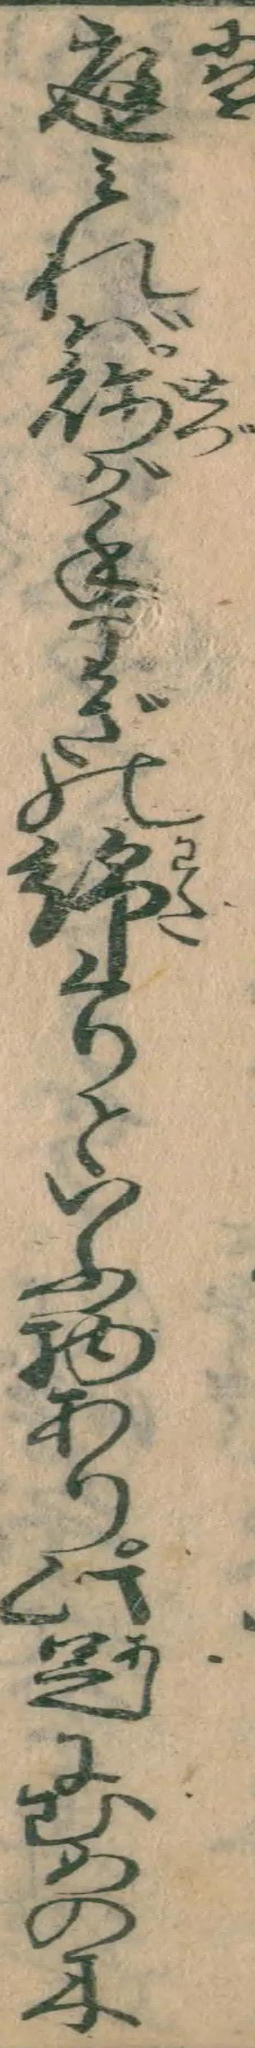庭みれば。賤が手わざの綿くりといふ物あり。此足にむめの木
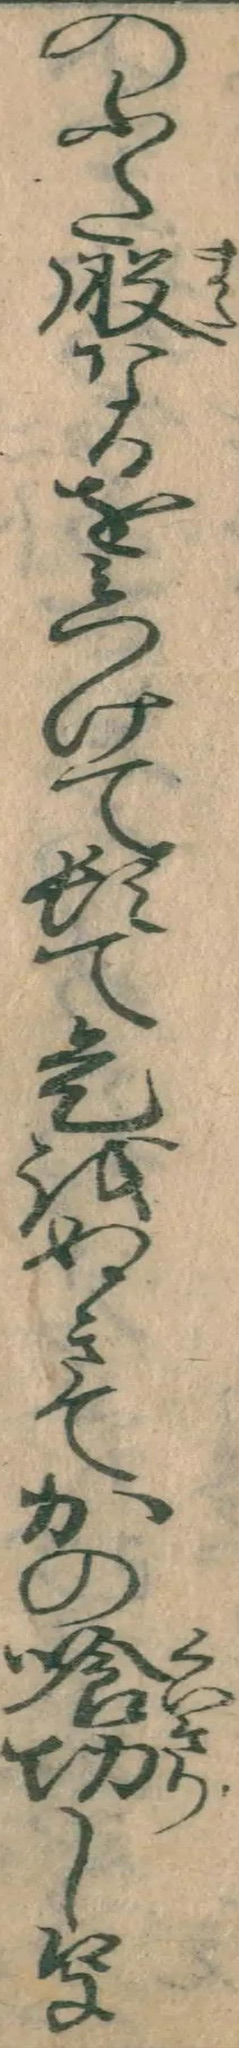のふた股なるをみつけて頓て是をぬきてかの喰切し口に
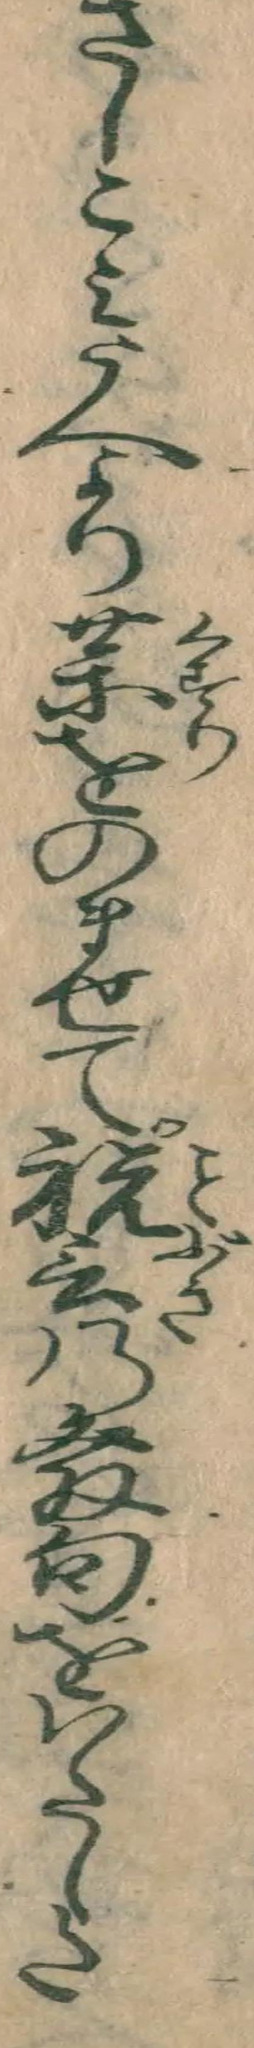さしこみうへより薬をのませて。祝言の発句をいたした
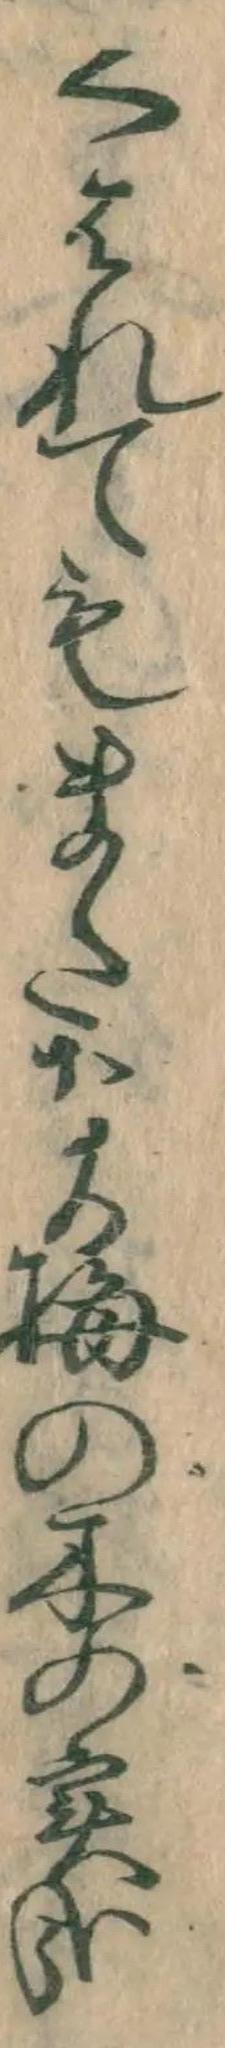くはれてもまたなる梅の木の実哉
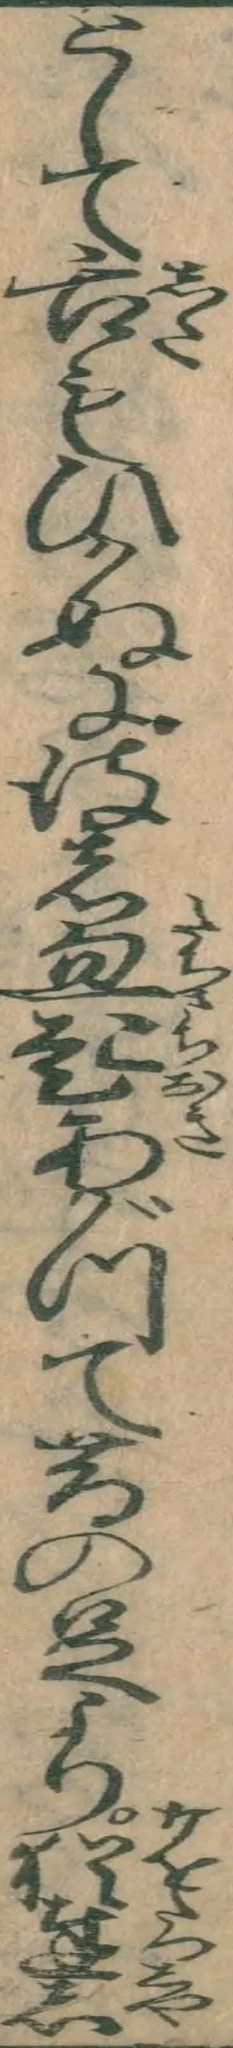として舌もひかぬに彼者忽起あがつて昔の足より。猶達者

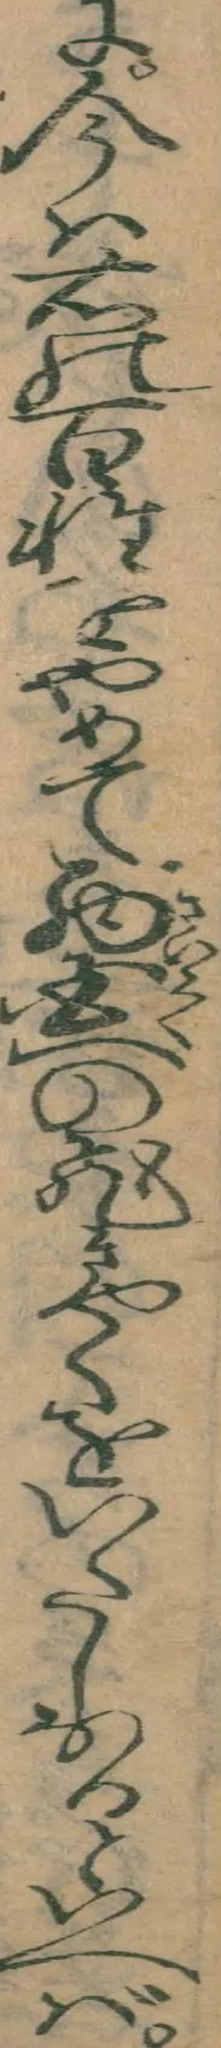に。今は右の百性をやめて西国への飛きやくをいたしおるといへば。
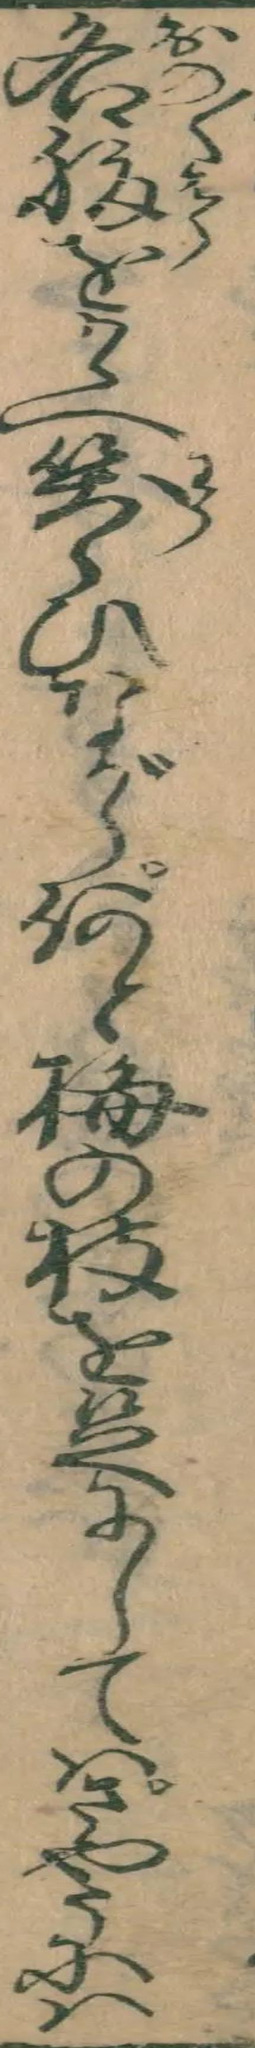各腹をかゝへ笑らひながら。何と梅の枝を足にしては。さやうには
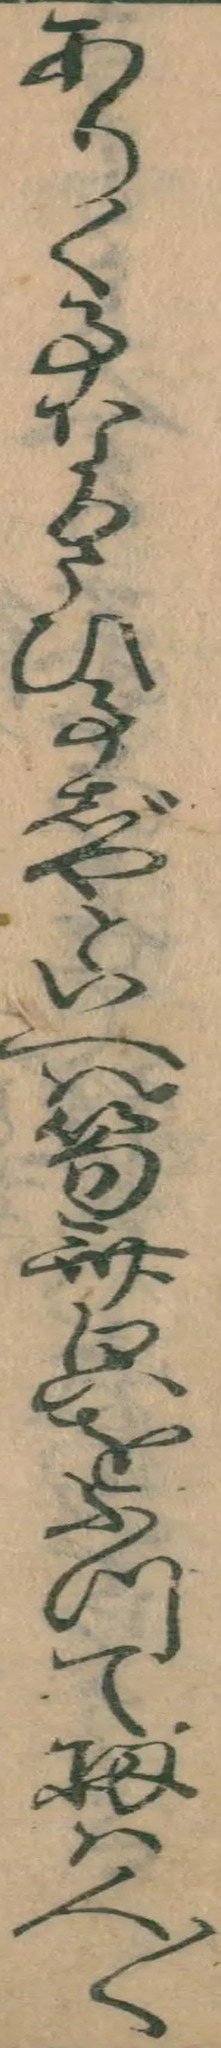ありく事なるまひ事じやといへは筍斎貌をふつて扨は人々
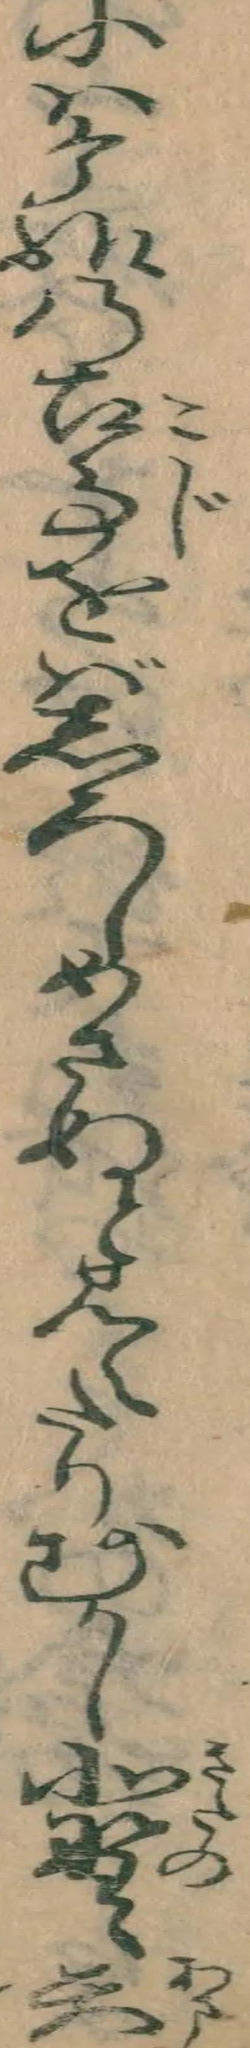にはか様の古事をばしろしめさぬと見えたり。むかし北野天
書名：新竹斎 5巻
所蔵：国立国会図書館 National Diet Library, JAPAN
